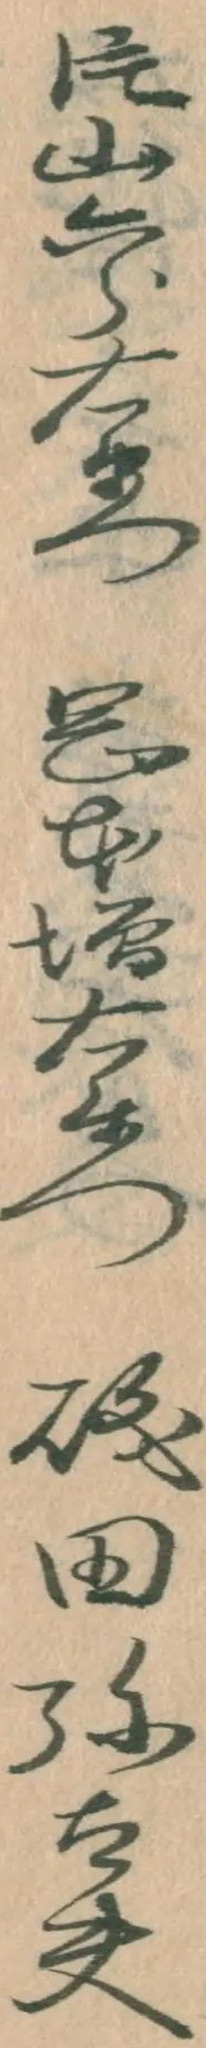片山六郎右衛門岡本升右衛門磯田弥太夫
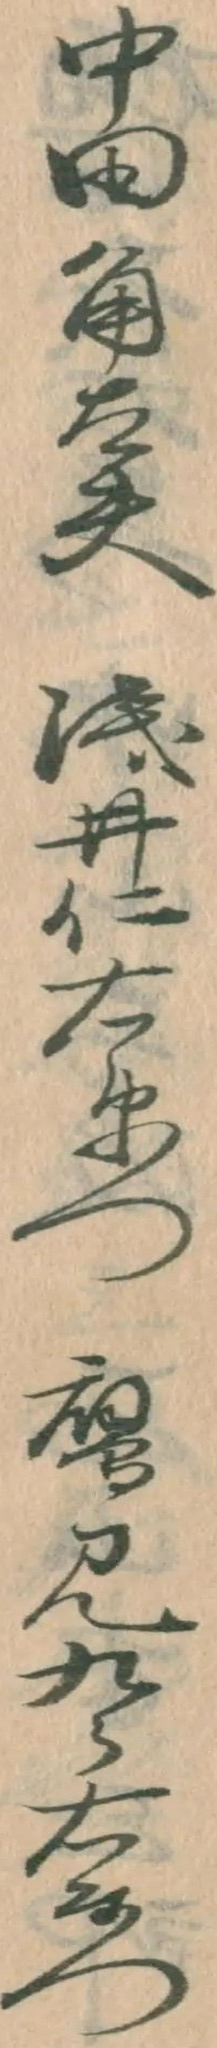中田角太夫浅井仁右衛門鷹見九郎右衛門

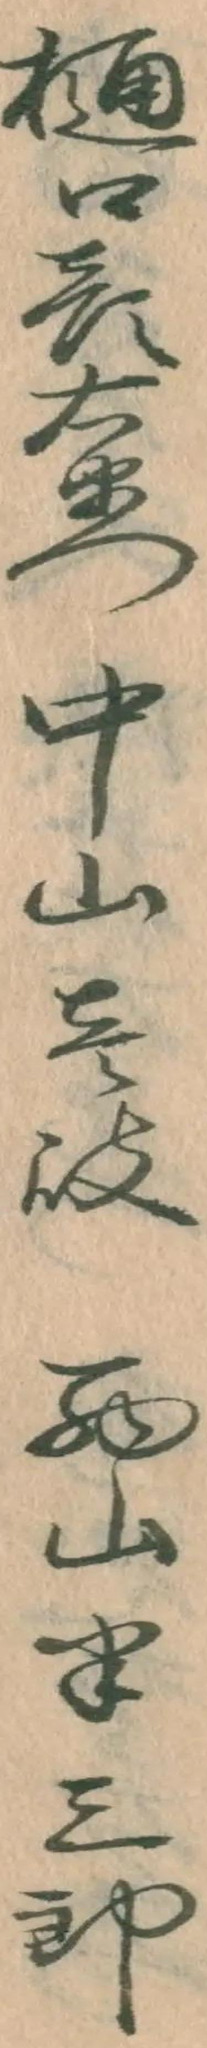樋口彦右衛門中山壱岐西山半三郎
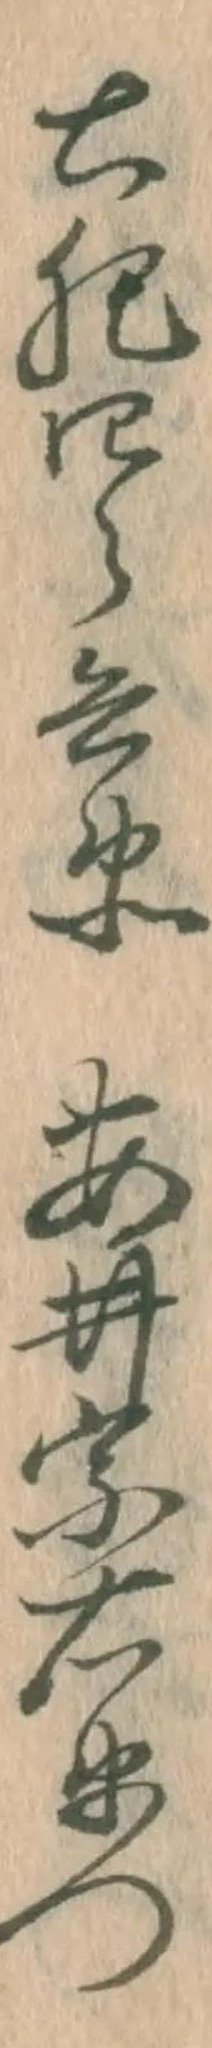土肥四郎兵衛安井宗右衛門
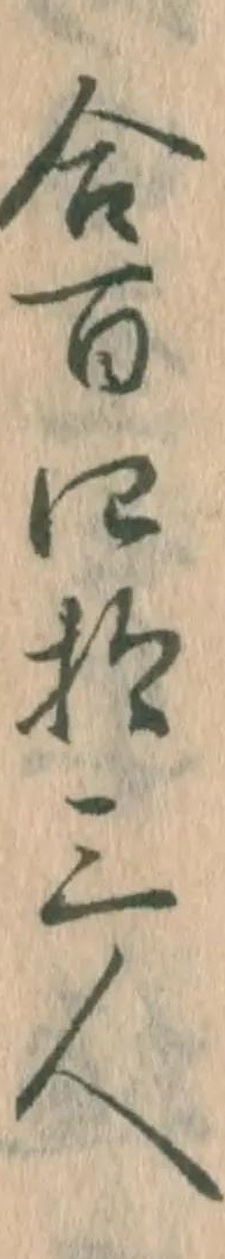合百四拾三人
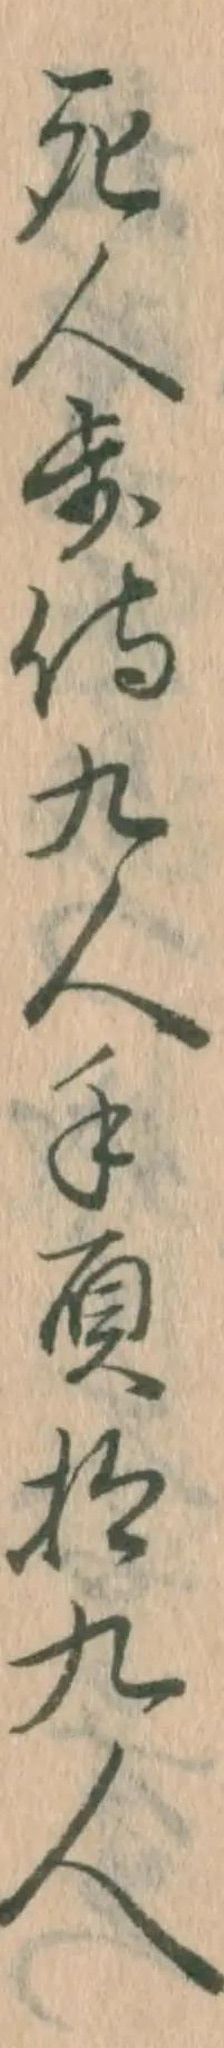死人歩侍九人手負十九人
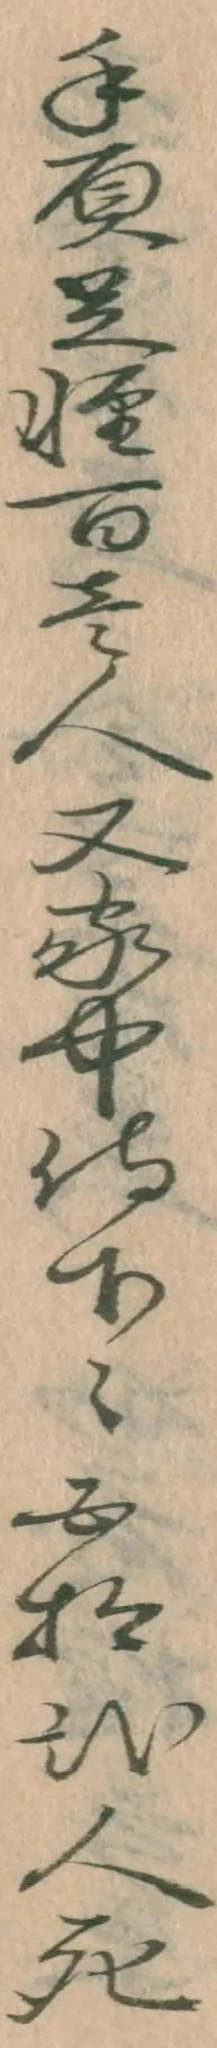手負足軽百壱人又家中侍下々五拾弐人死
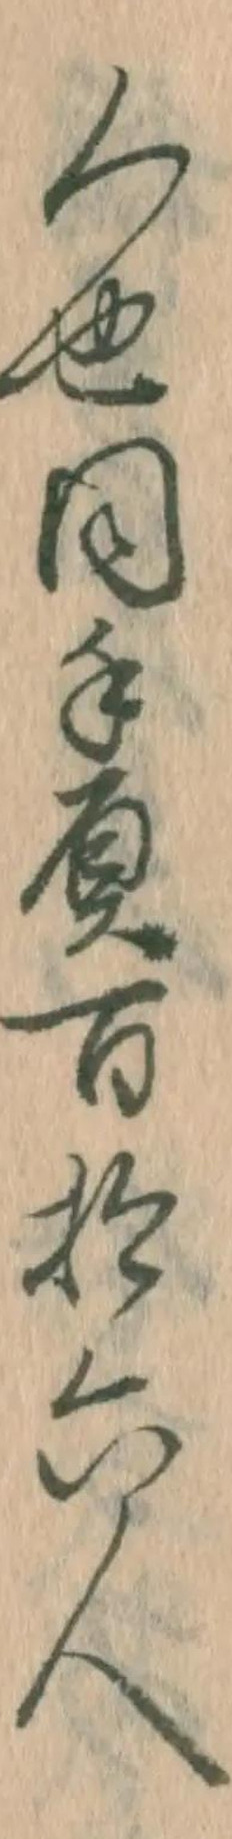人也同手負百拾六人
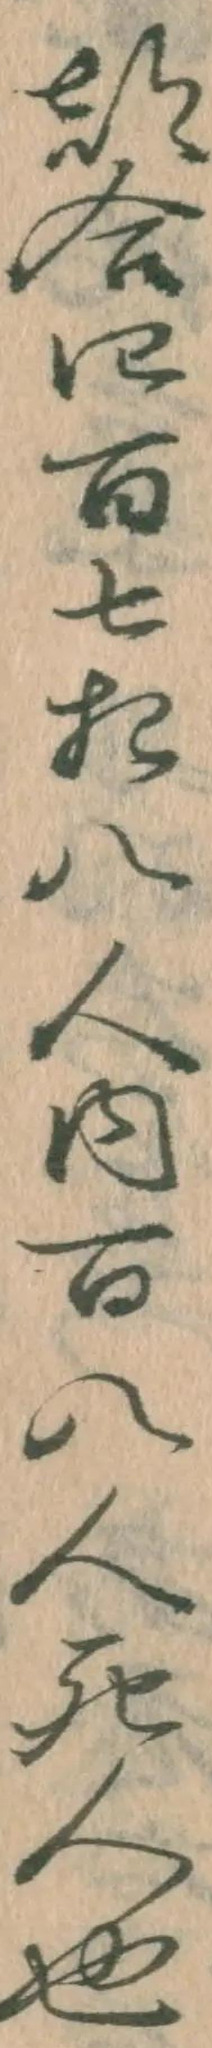都合四百七拾八人同百八人死人也
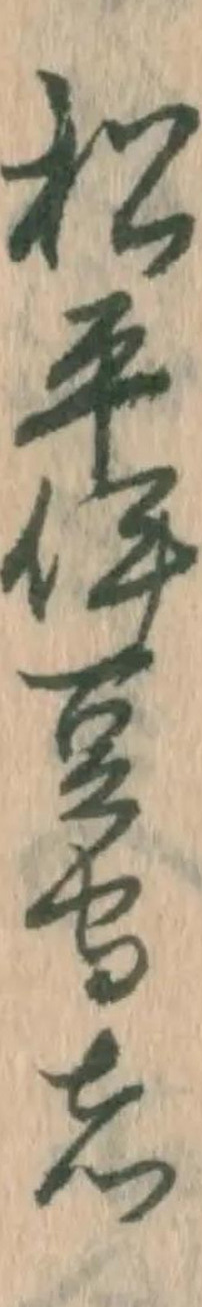松平伊豆守者
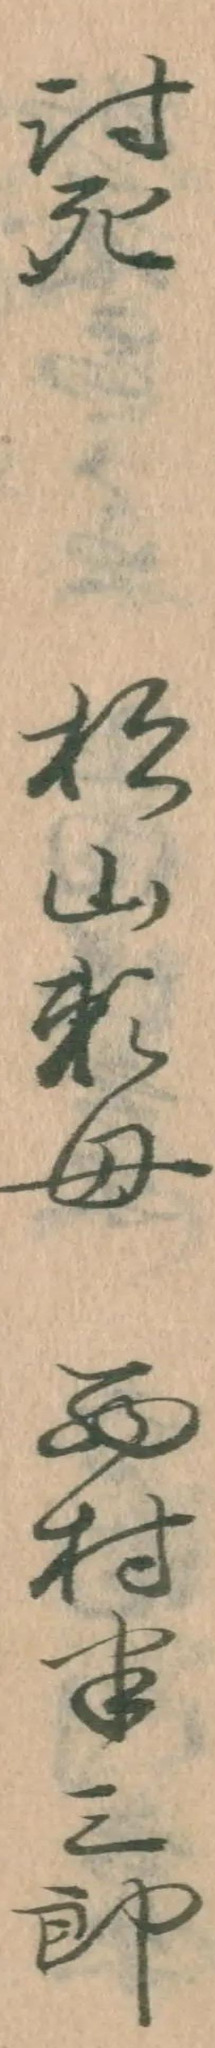討死杉山頼母西村半三郎
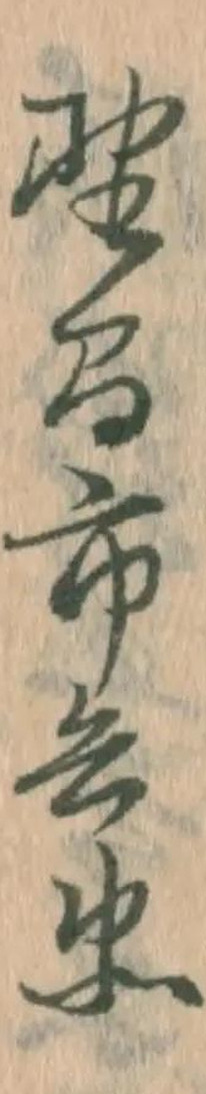野間市兵衛
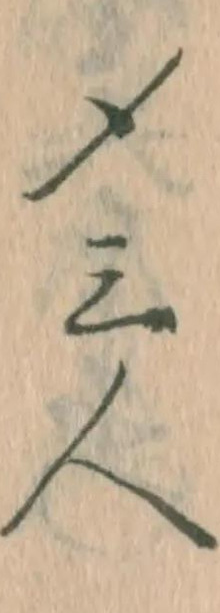〆三人
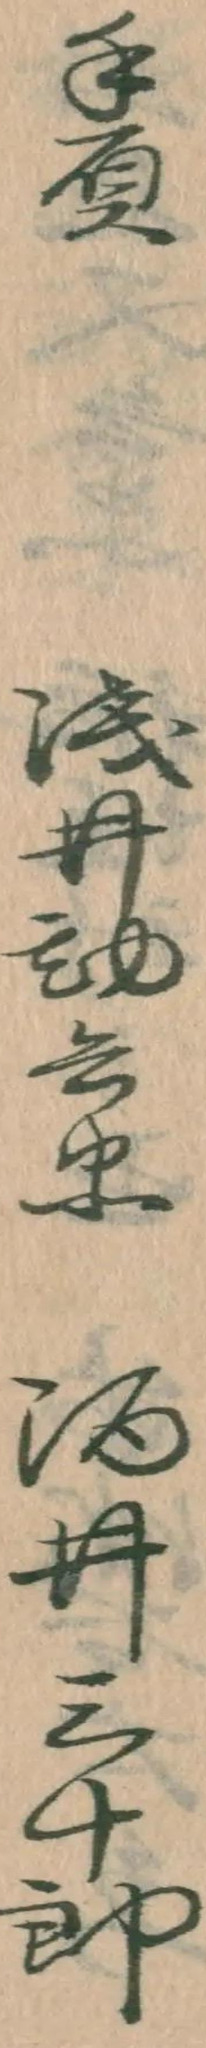手負浅井勘兵衛酒井三十郎
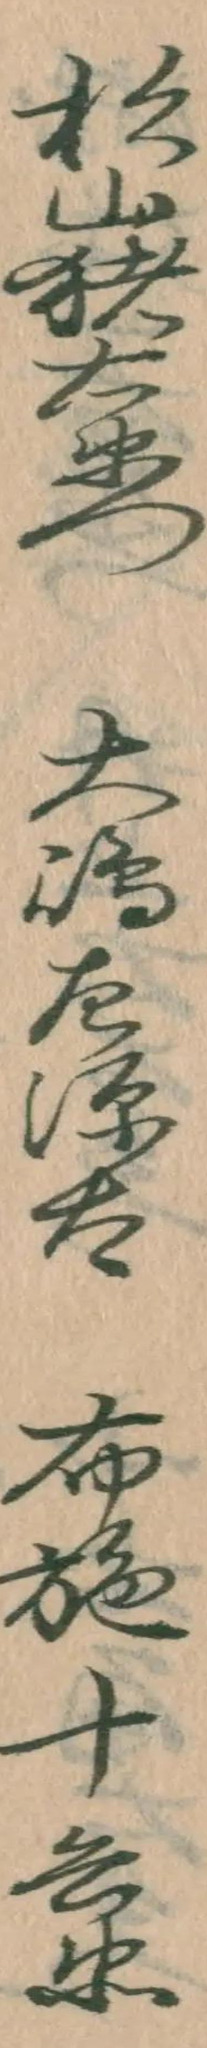杉山猪右衛門大島左源太布施十兵衛
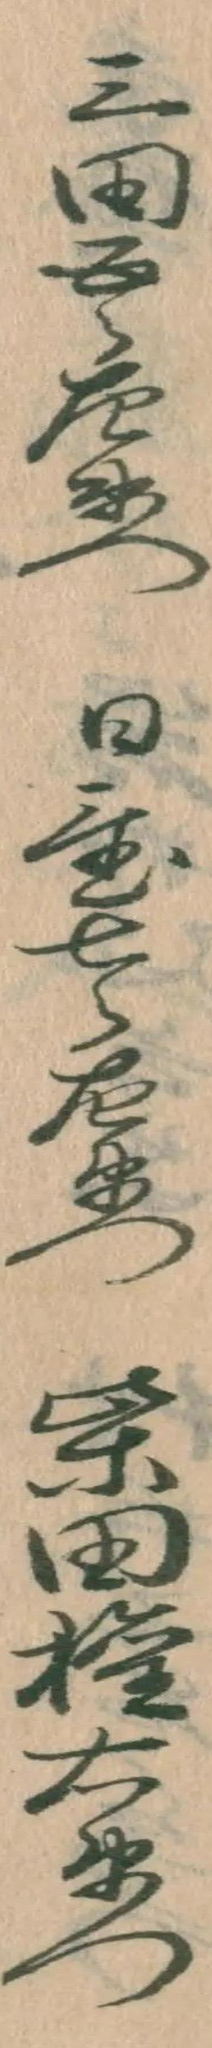三田五郎左衛門日置七郎左衛門柴田権右衛門
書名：切支丹御退治記 49巻. [9]
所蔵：国立国会図書館 National Diet Library, JAPAN
